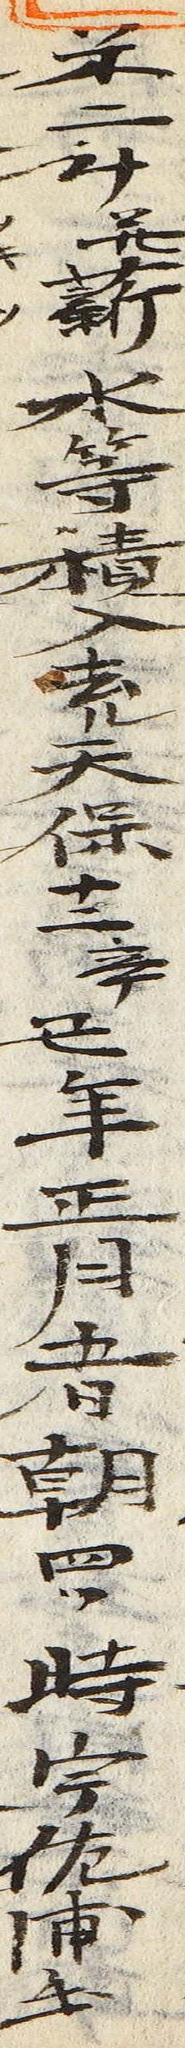米二斗并薪水灯等積入去ル天保十二辛丑年正月五日朝四ッ時宇佐浦出
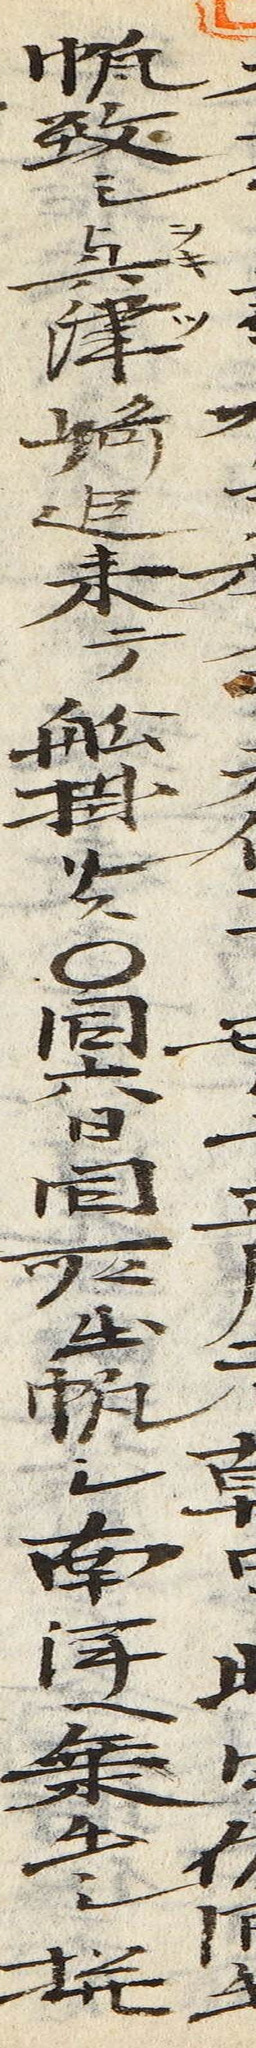航致シ奥津崎追来テ船掛リス〇同六日同所出航シ南洋へ乗出シ拼
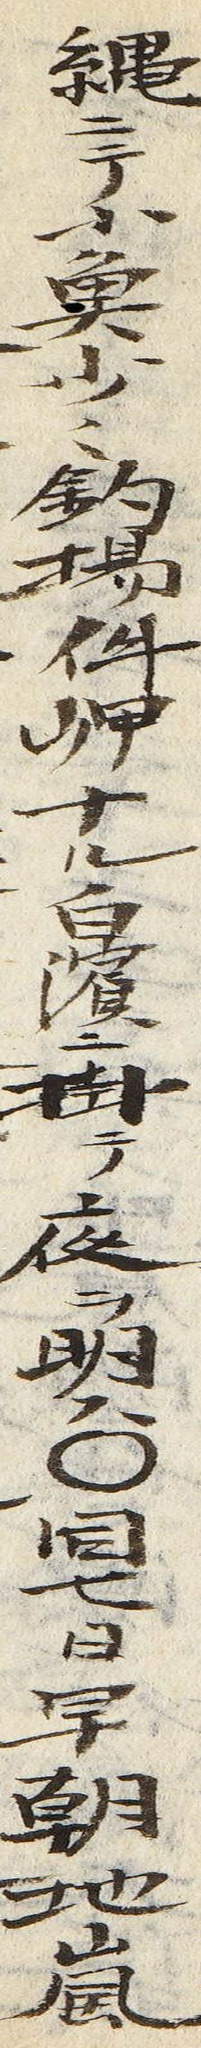縄ニテ小魚少々釣揚件岬ナル白浜ニ掛テ夜ヲ明ス〇同七日早朝地嵐
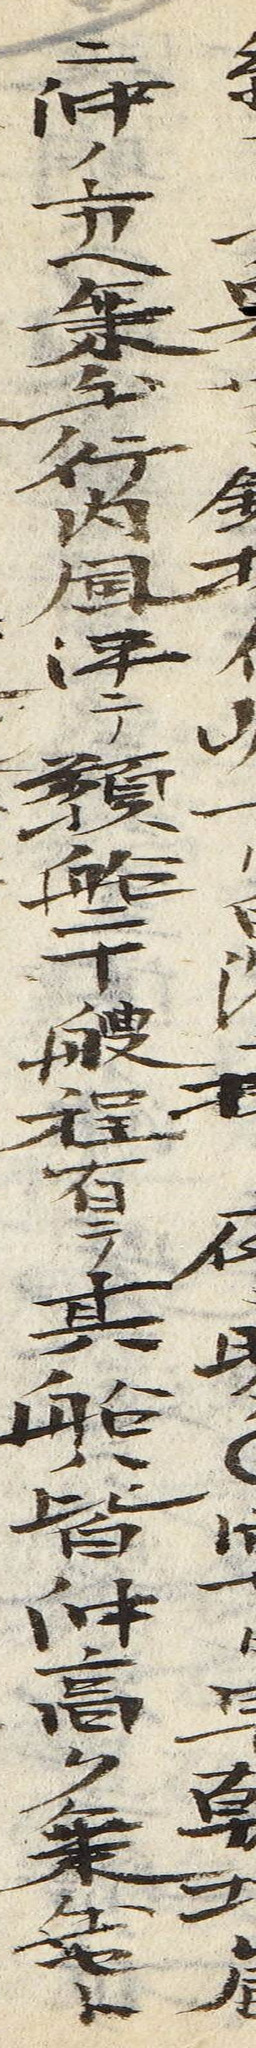ニ沖ノ方へ集と行内風泙テ預船二十艘程有テ其船ハ皆沖高ク乗出セト
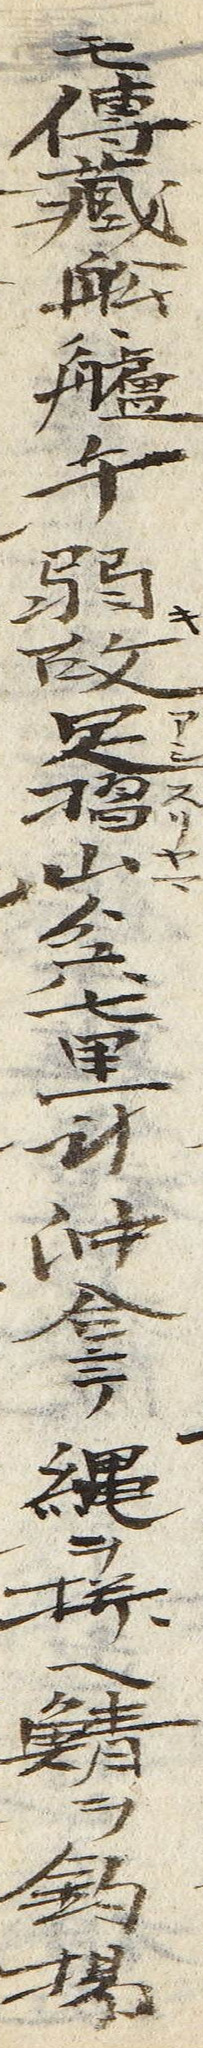モ傳蔵船ハ艫午弱故足摺山ゟ五六里計沖合ニテ縄ヲ拼へ鯖ヲ釣揚
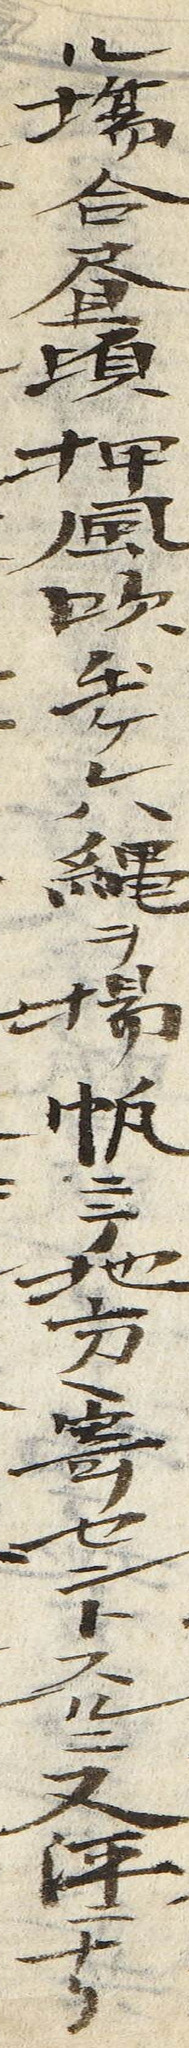ル場合昼頃押風吹出ケレハ縄ヲ揚帆ニテ地方へ寄セントスルニ又泙ニナリ
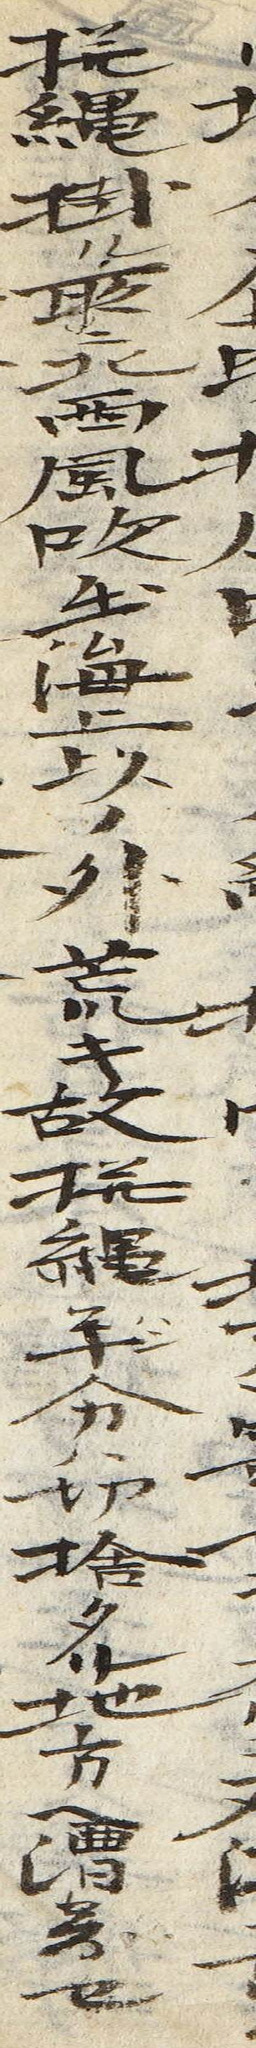拼縄掛ル取ニ北西風吹出海上以ノ外荒キ故拼縄半分捨タル地方ヘ漕寄セ
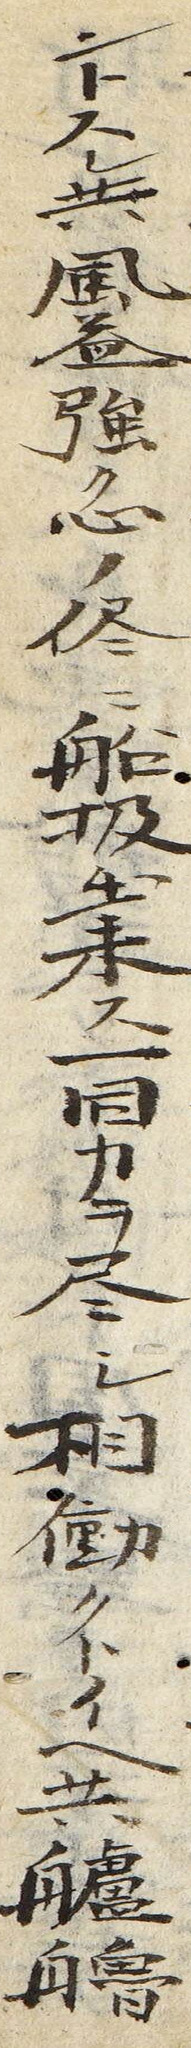ントスレ共風益強ク心ノ侭ニ船扱へ出来ス一同カラ尽シ相働クトイヘ共艫艪

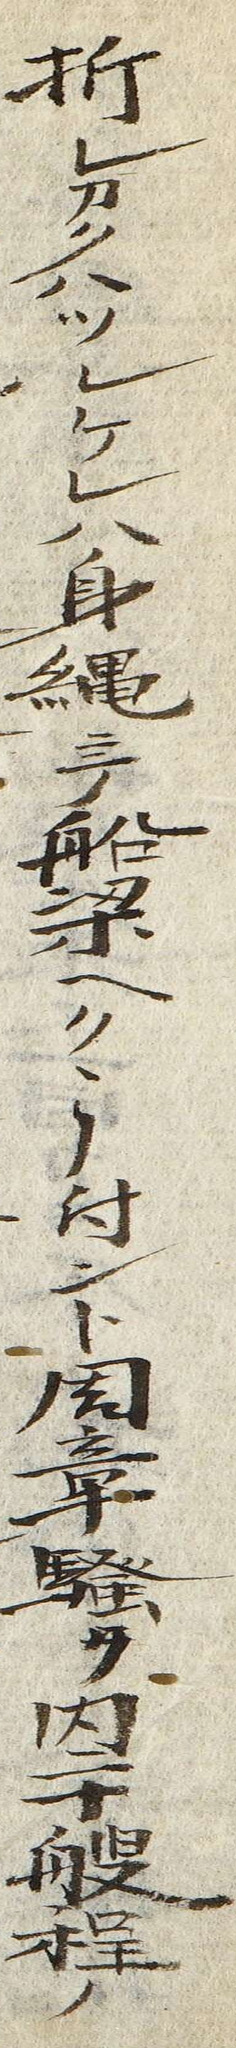折レカクハツレケレハ身縄ニテ船梁へク丶リ付ント周章騒ク内二十艘程ノ
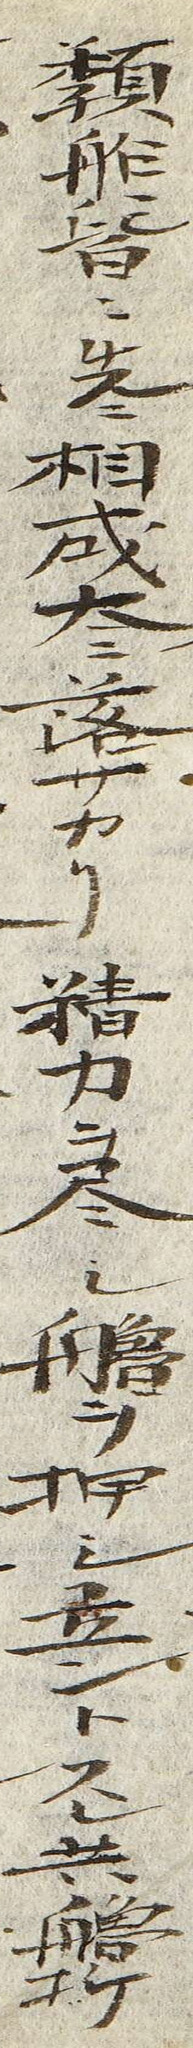類船皆々先ニ相成大ニ落サカリ精力ヲ尽シ艪ヲ押シ立ントスレ共艪折
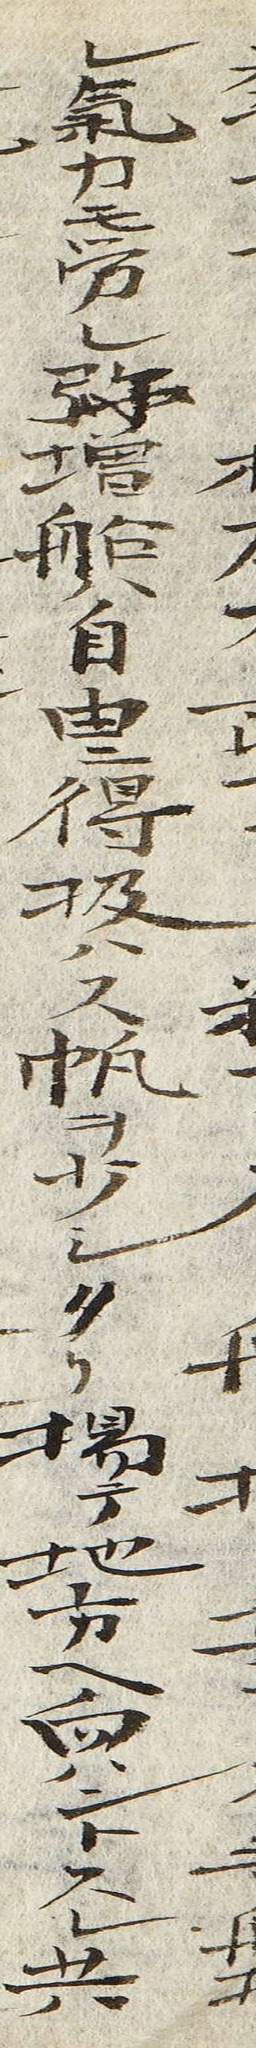レ気力モ労シ弥増船ハ自由ニ得扱ハス帆ヲ少シクリ揚テ地方へ向ハントスレ共
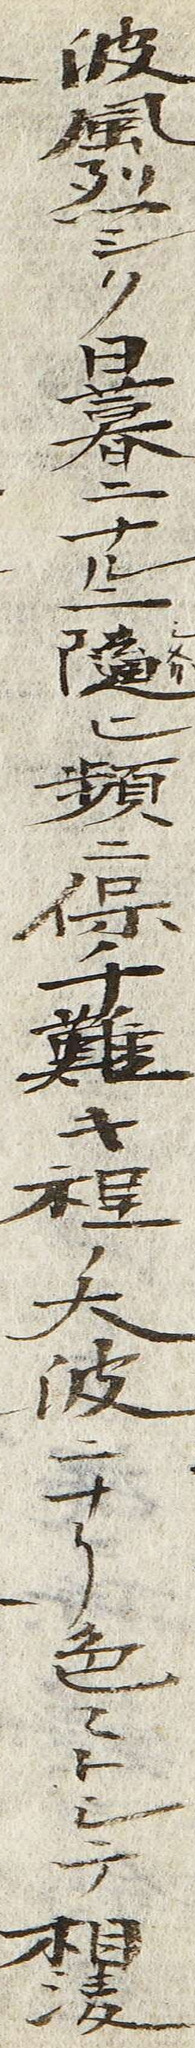波風烈シク日暮ニナルニ随ヒ頻ニ保チ難キ程ノ大波ニ菜ナリ色々トシテ相凌
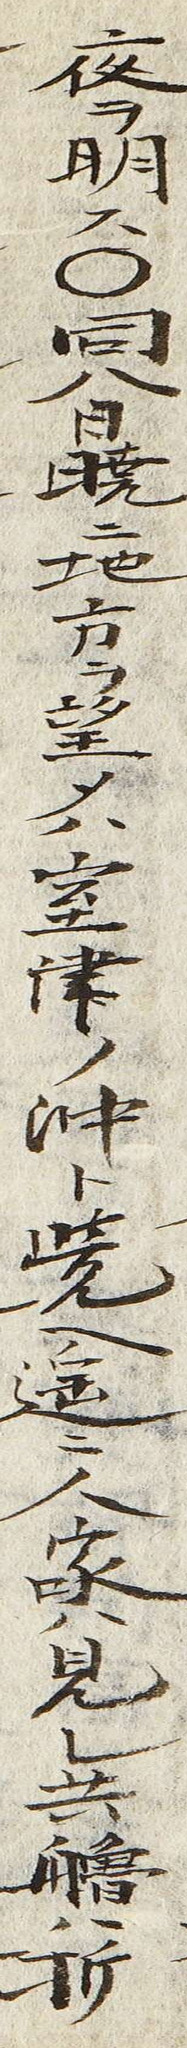夜ヲ明ス〇同八日暁ニ地方ヲ望メハ室津ノ沖ト覚へ遥ニ人家ハ見レ共艪ハ折
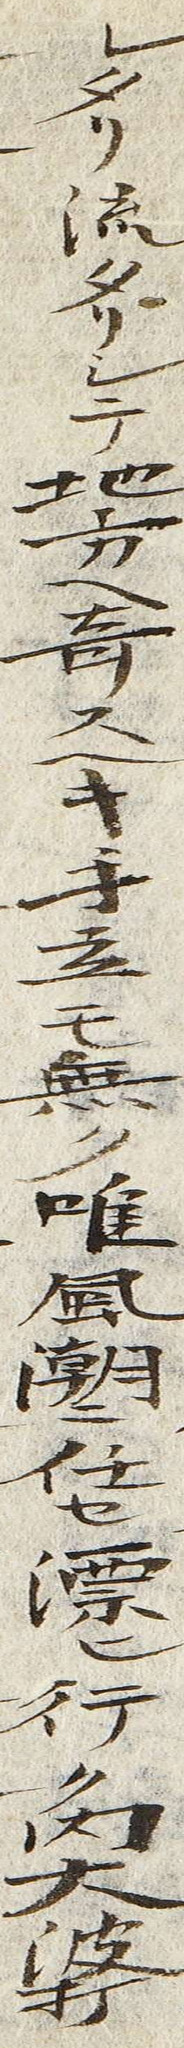レタリ流タリシテ地方ヘ寄スヘキ手立モ無ク唯風潮ニ任セ漂ヒ行ク内大波打
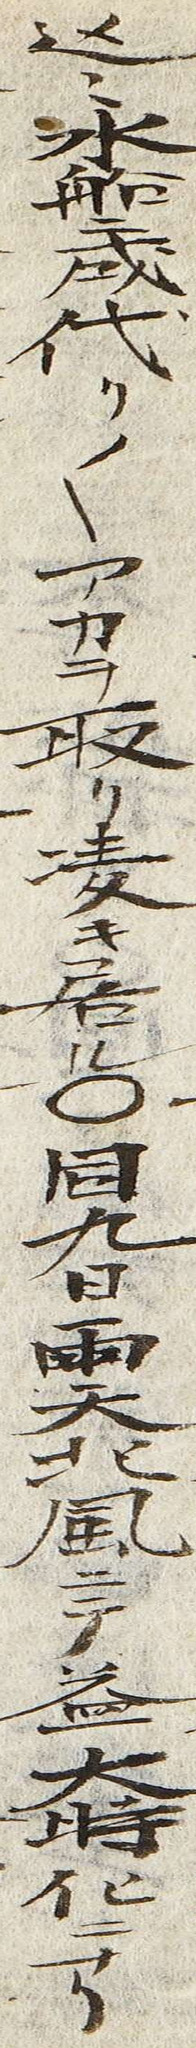込ニ水船ニな成代リ〳〵アカヲ取リ凌キ居ル〇同九日雨天北風ニテ益大時化ニナリ
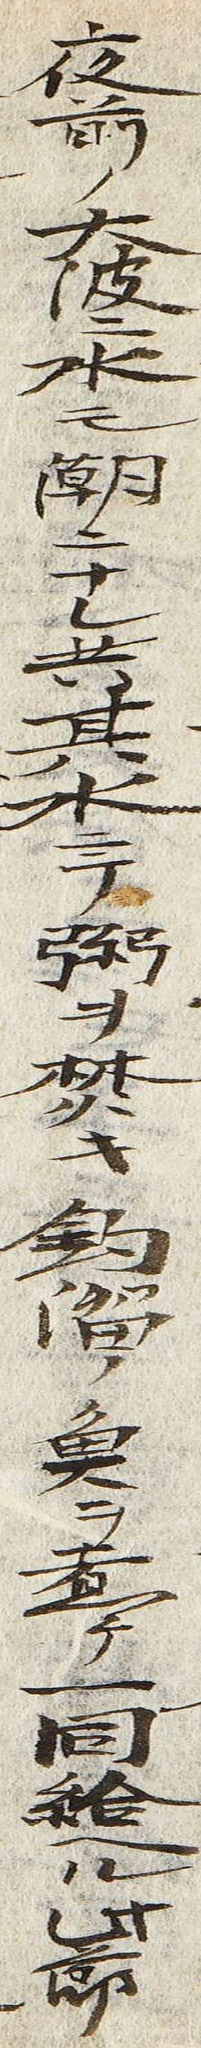夜前ノ大波にニモ潮ニナレ共其水ニテ粥ヲ焚キ釣溜ノ魚ヲ煮テ一同給ヘル此節
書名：漂流記聞
